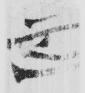正
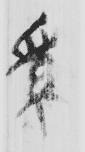奚
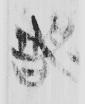若
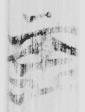亞
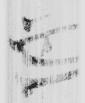正
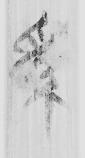奚
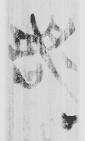若
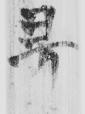𡵂
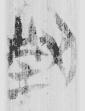型
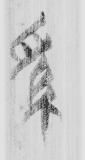奚
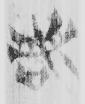若
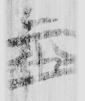亞
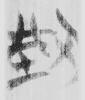型
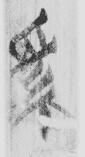奚
